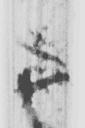之
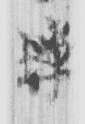{土丰}
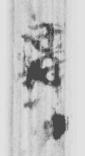{圭畕}
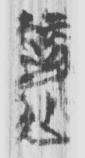{麗止}
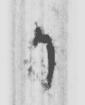人
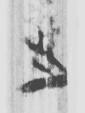之
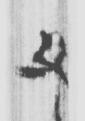父
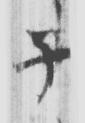子
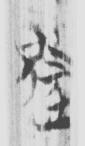{兄㞷}
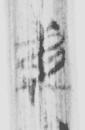弟
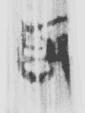取
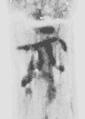亓
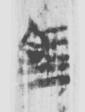馬
